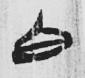白
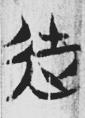徒
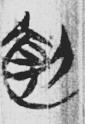○（食）
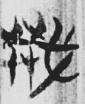○（輂）
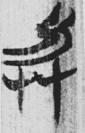兵
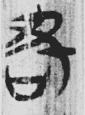各
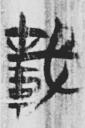載
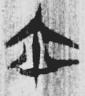尓
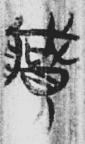○（藏）
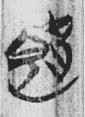既
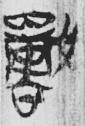○（戰）
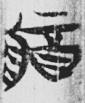𨟻（將）
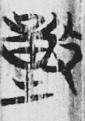○（量）
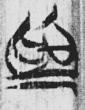爲
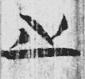之
